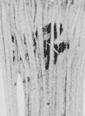子
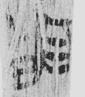○（聞）
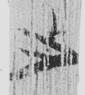之
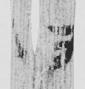曰
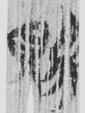賜
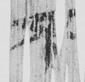不
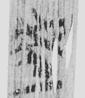○（吾）
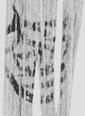智（知）
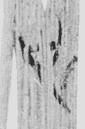也
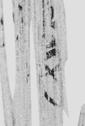○（夙）
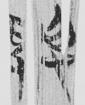興
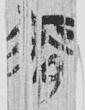夜
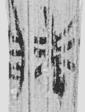○（寐）
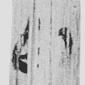㠯
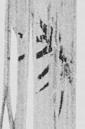求
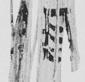聞
